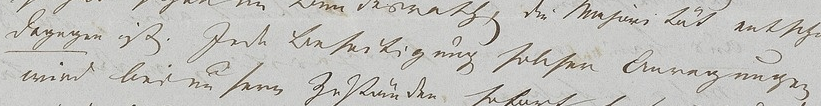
dagegen ist. Jede Beseitigung solcher Anregungen
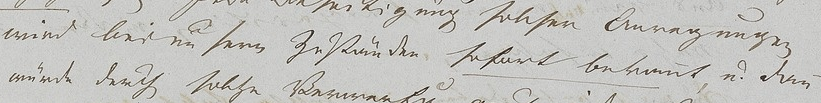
wird bei unsern Zuständen sofort bekannt u. dann
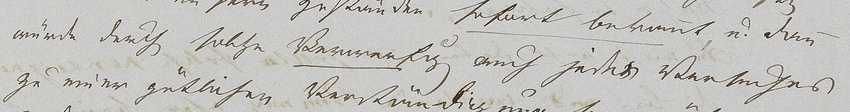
würde durch solche Verwerfung auch jedes Versuches
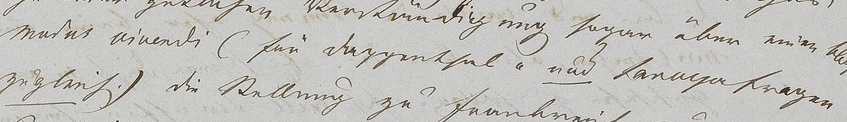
modus vivendi (für Dappenthal- undSavoyer fragen
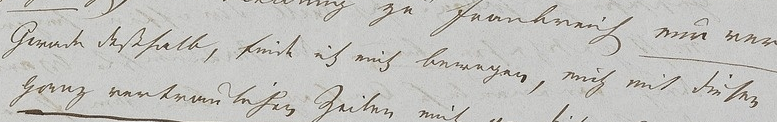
Gerade deßhalb, finde ich mich bewogen, mich mit diesen
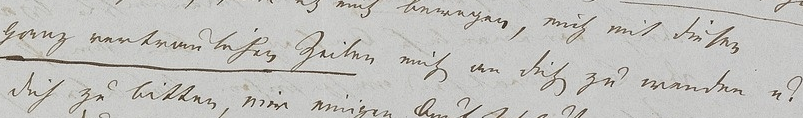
ganz vertraulichen Zeilen mich an dich zu wenden u.
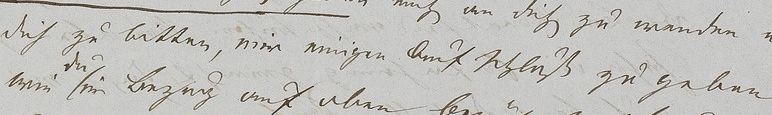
dich zu bitten, mir einigen Aufschluß zu geben
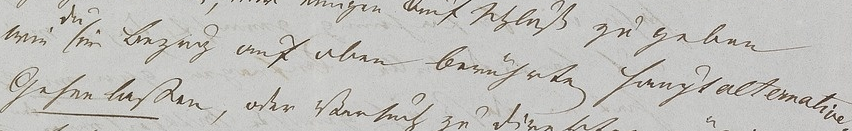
wie du in Bezug auf oben berührte Hauptalternative,
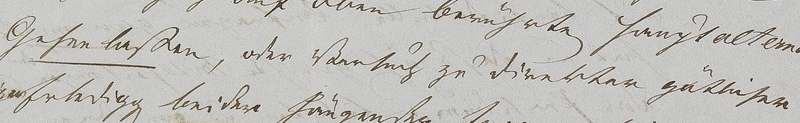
Gehen laßen, oder Versuch zu direkter gütlicher
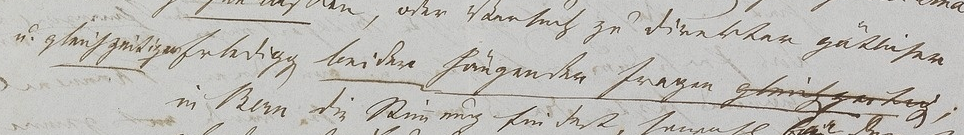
u. gleichzeitiger Erledigg beider hängender Fragen gleichzeitig;
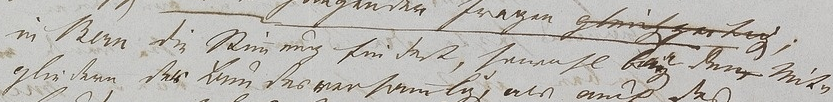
in Bern die Stimmung findest, sowohl bei den Mit-
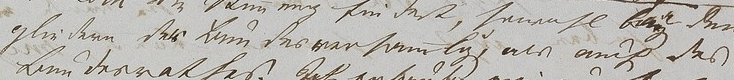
gliedern der Bundesversammlung, als auch des
